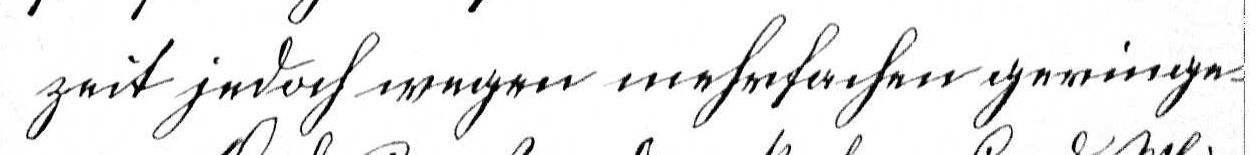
zeit jedoch wegen mehrfachen geringe¬
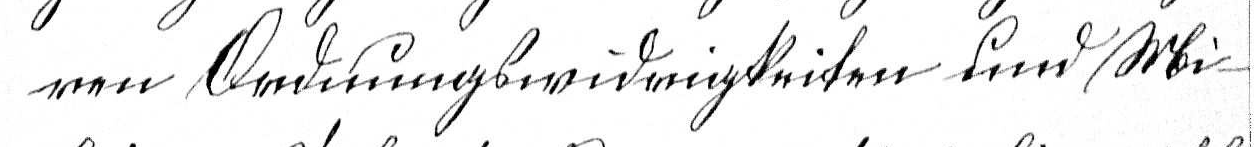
ren Ordnungswidrigkeiten und Mi¬
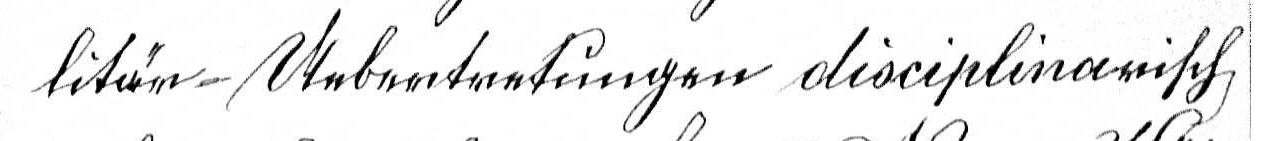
litär-Uebertretungen disciplinarisch
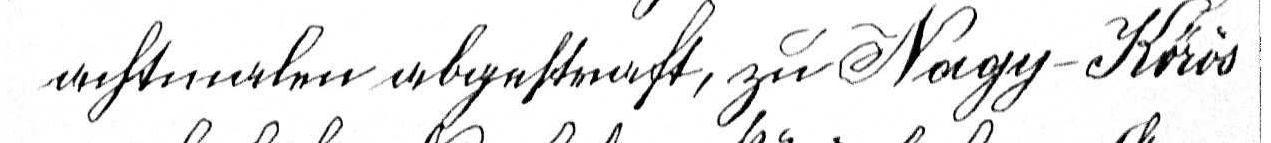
achtmalen abgestraft, zu Nagy-Kőrös
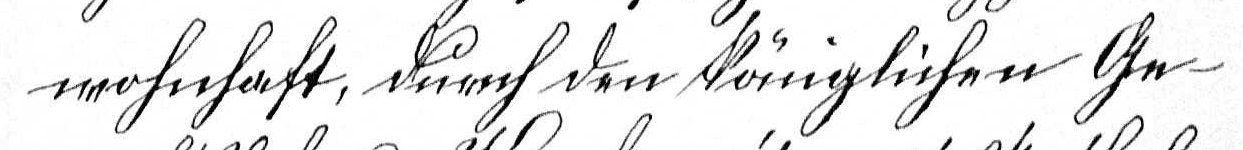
wohnhaft, durch den königlichen Ge¬
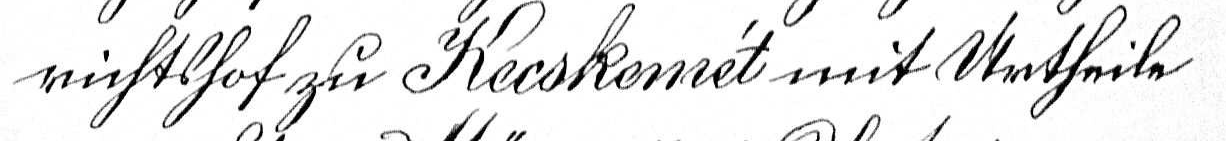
richtshof zu Kecskemét mit Urtheile
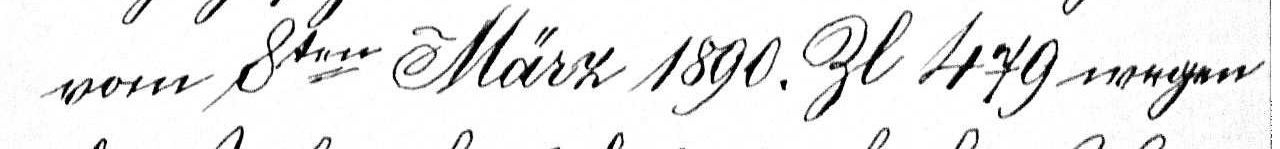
vom 8ten März 1890 Zl 479 wegen
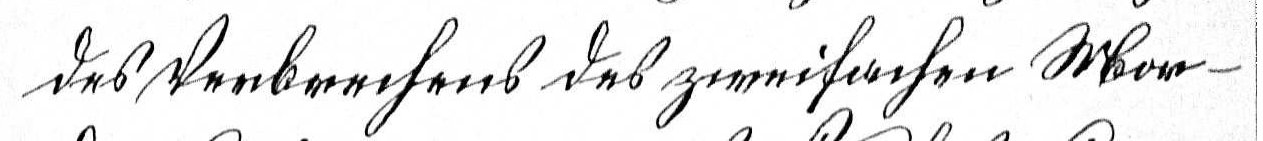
des Verbrechens des zweifachen Mor¬
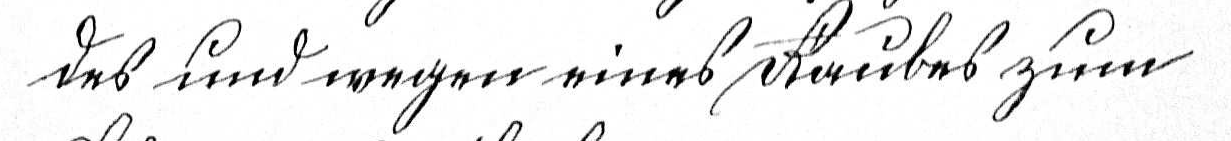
des und wegen eines Raubes zum
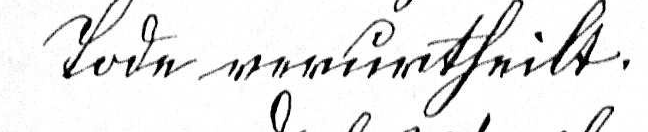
Tode verurtheilt.
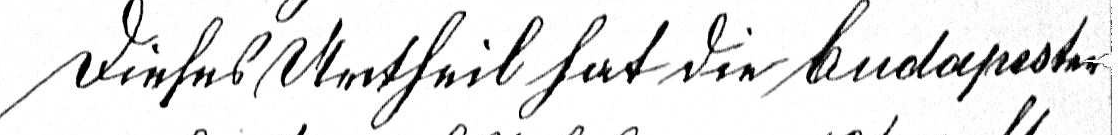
Dieses Urtheil hat die Budapester
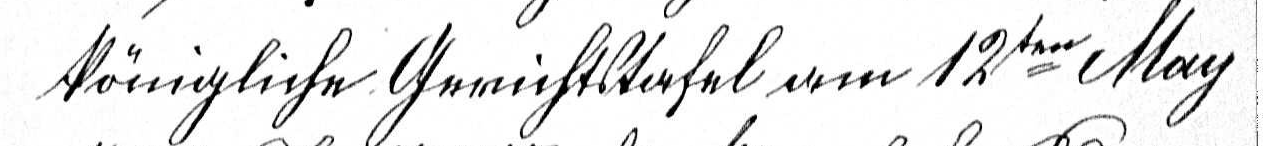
königliche Gerichtstafel am 12ten May
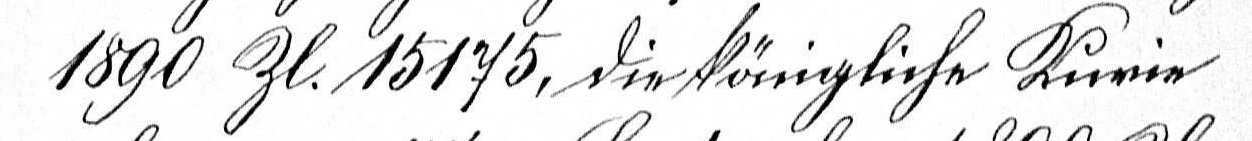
1890 Zl 15175, die königliche Kurie
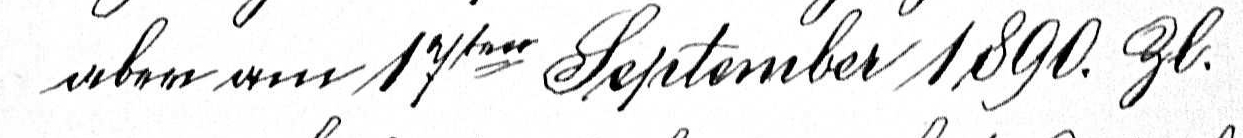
aber am 17ter September 1890 Zl
